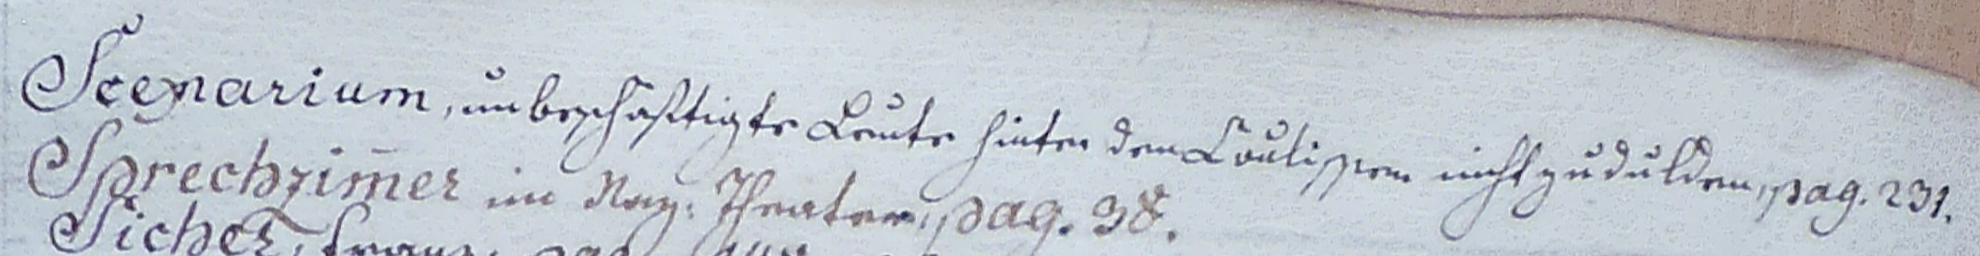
Scenarium,unbeschäftigte Leute hinter den Coulissen nicht zu dulden, pag. 231.
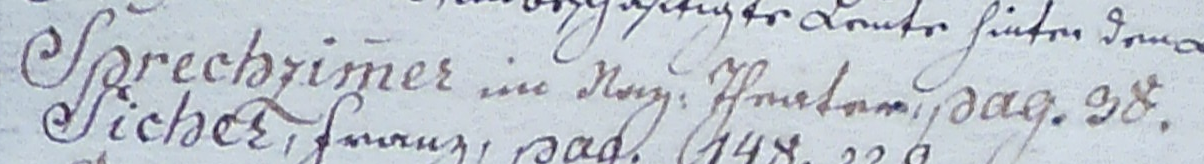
Sprechzim̅er im Naz: Theater, pag. 38.
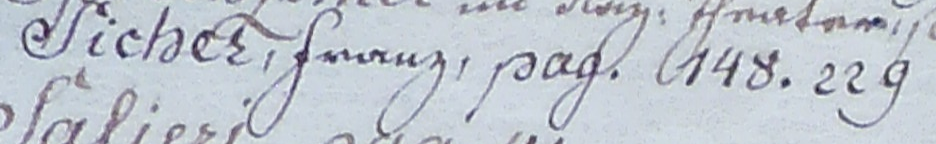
Sicher, Franz, pag. 148. 229.
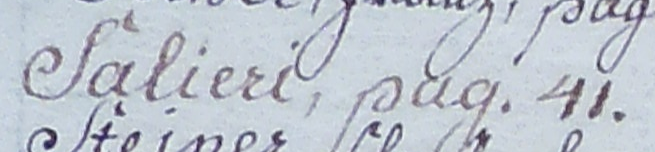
Salieri, pag. 41.
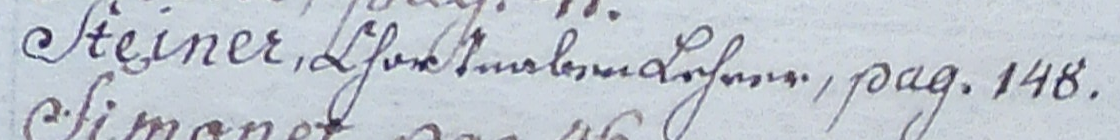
Steiner, Chorknaben Lehrer, pag. 148.
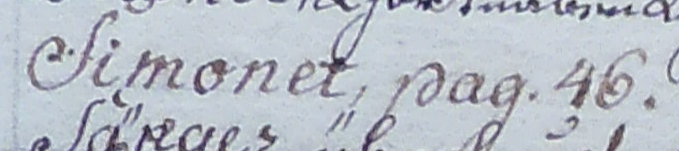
Simonet, pag. 46.
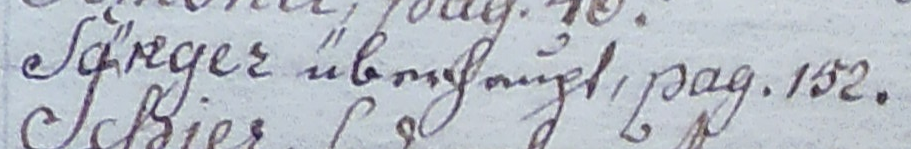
Sänger überhaupt, pag. 152.
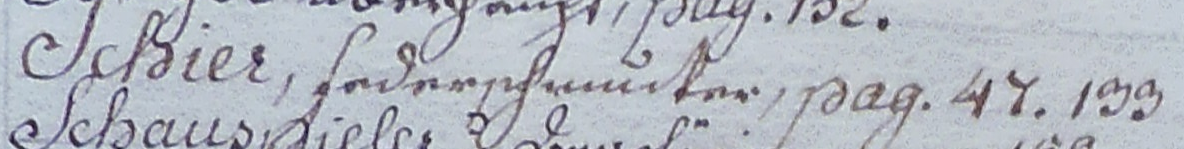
Schier, Federschmucker, pag. 47. 133.
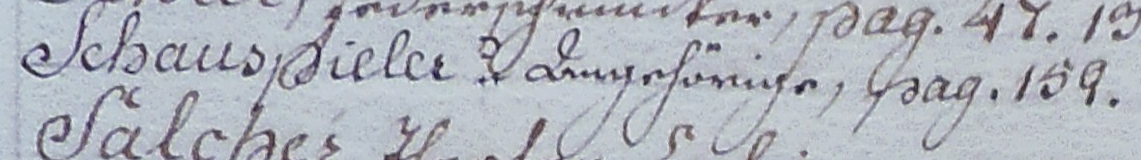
Schauspieler u Angehörige, pag. 159.
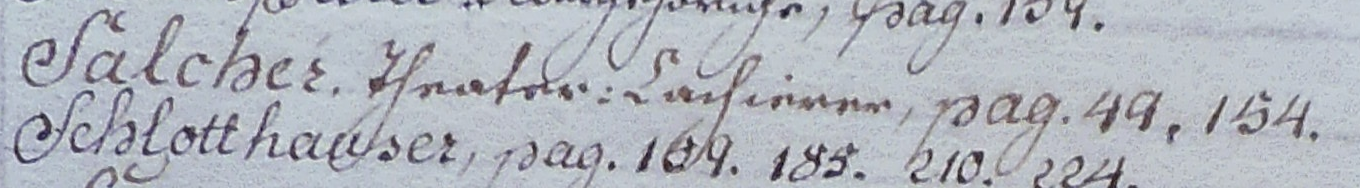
Salcher, Theater: Cachierer, Pag. 49. 154.
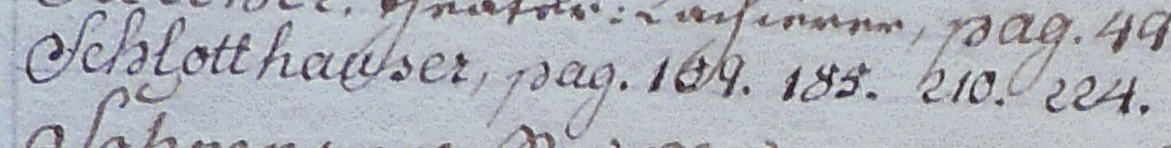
Schlotthauser, pag. 159. 185. 210. 224.
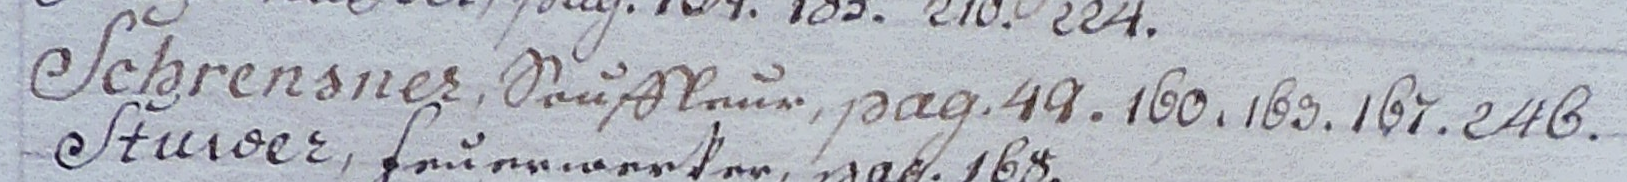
Schrensner, Souffleur, pag. 49. 160. 163. 167. 246.
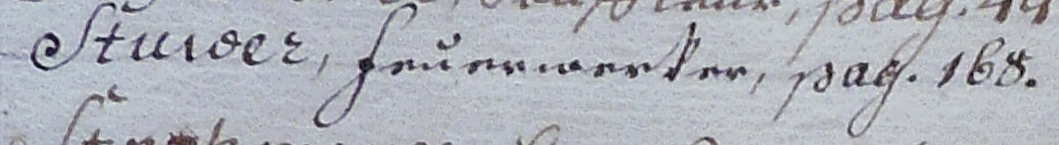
Stuwer, Feuerwerker, pag. 168.
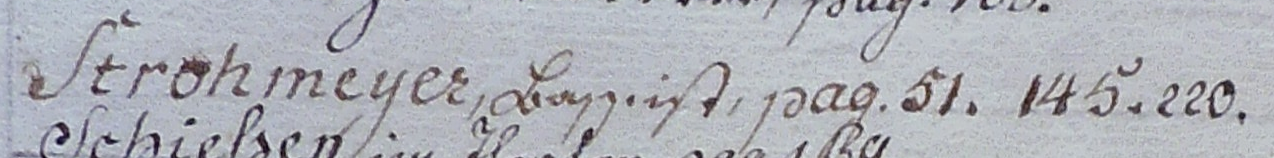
Strohmeyer, Bassist, pag. 51. 145. 220.
